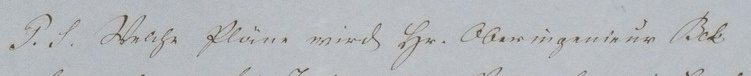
P. S. Welche Pläne wird Hr. Oberingenieur Bek
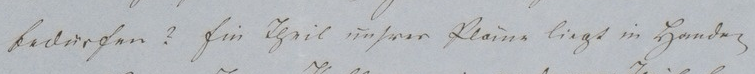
bedürfen? Ein Theil unsrer Pläne liegt in Handen
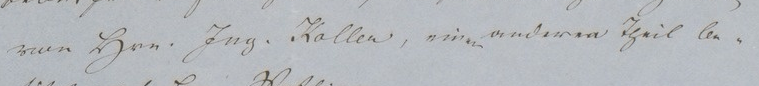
von Hrn. Ing. Koller, einen anderen Theil be-
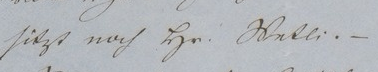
sitzt noch Hr. Wetli. –
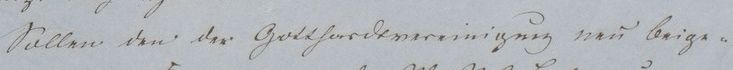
Sollen den der Gotthardtvereinigung neu beige-
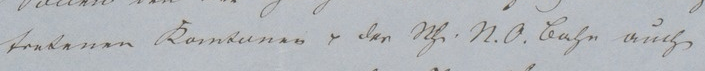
tretenen Kantonen & der Sch. N.O.bahn auch
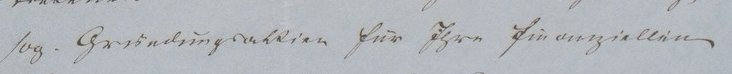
sog. Gründungsaktien für Ihre finanziellen
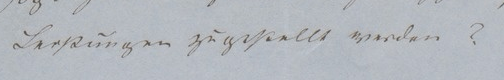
Leistungen zugestellt werden?
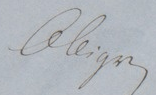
Obiger
